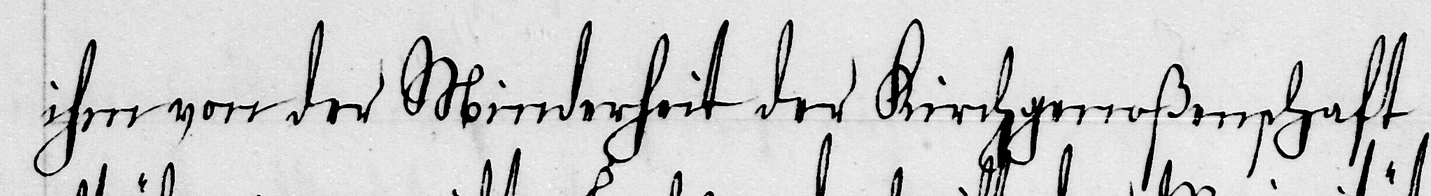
ihm von der Minderheit der Kirchgenoßenschaft
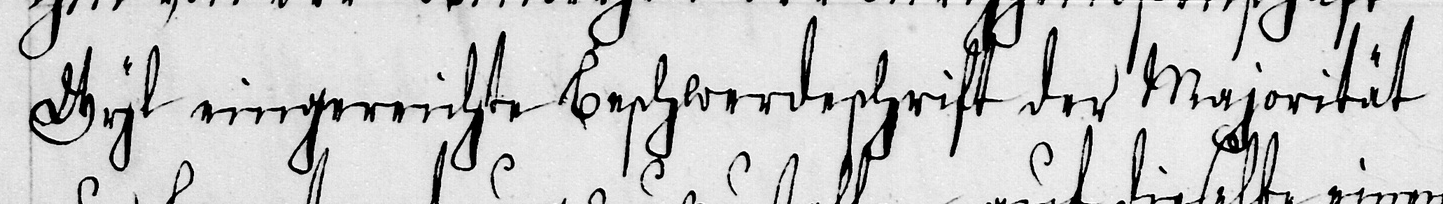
Wyl eingereichte Beschwerdeschrift der Majorität
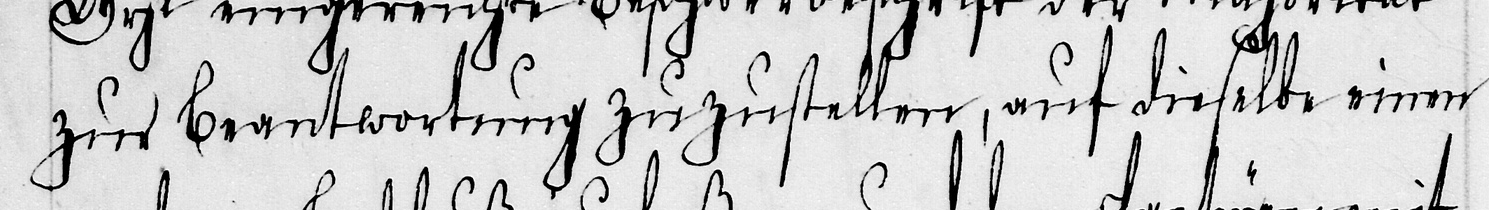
zur Beantwortung zuzustellen, auf dieselbe einen
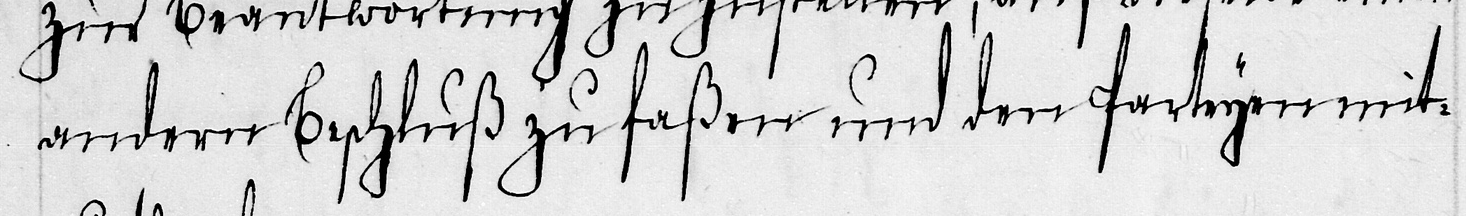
andern Beschluß zu faßen und den Parteyen mit¬
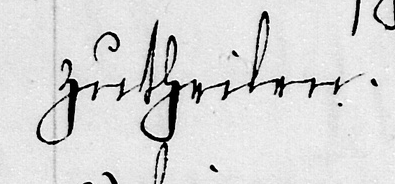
zutheilen:
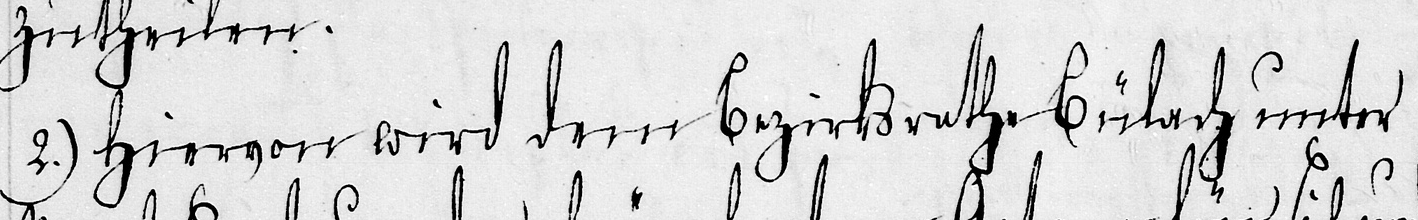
2.) Hiervon wird dem Bezirksrathe Bülach unter
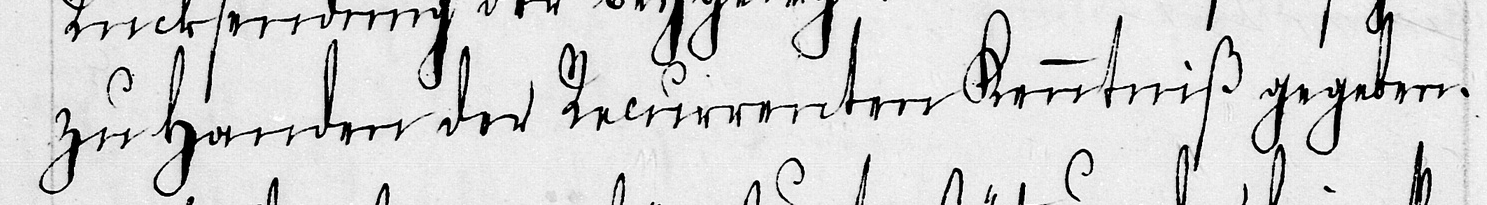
zu Handen der Recurrenten Kenntniß gegeben.
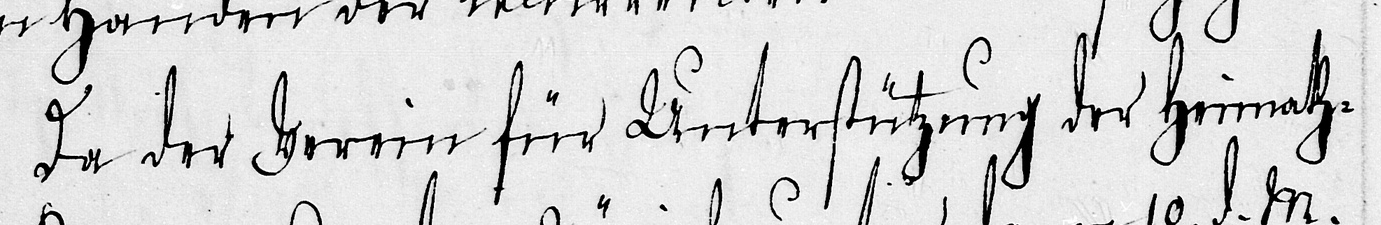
Da der Verein für Unterstützung der Heimath¬
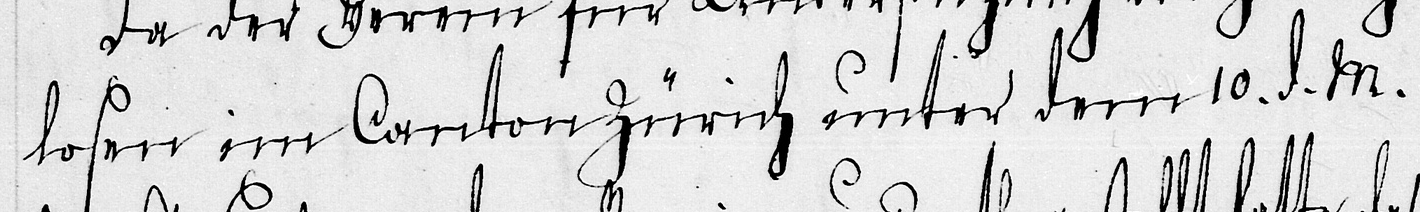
losen im Canton Zürich unter dem 10. d. M.
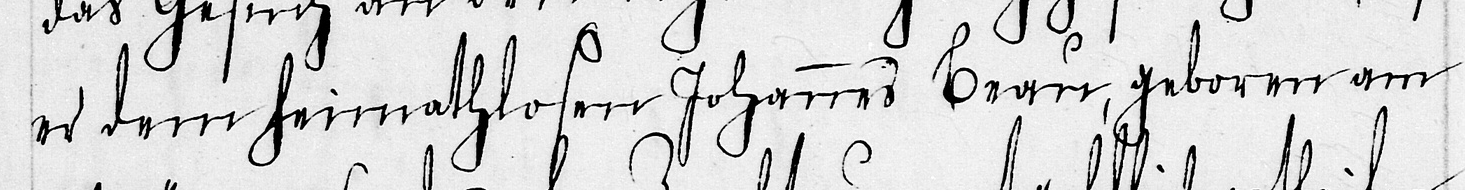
er dem heimathlosen Johannes Beau, geboren am
